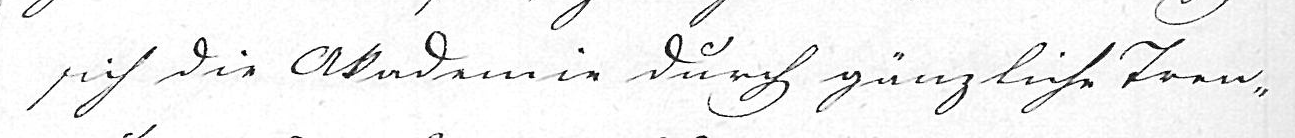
sich die Akademie durch gänzliche Tren-
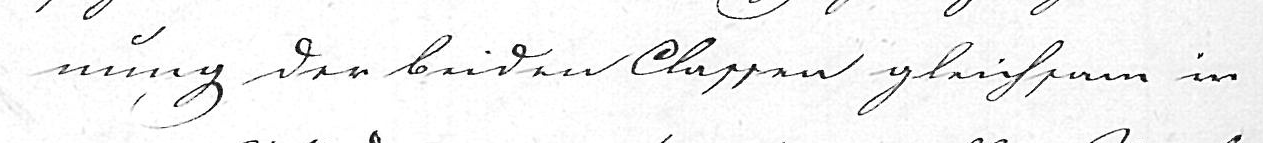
nung der beiden Classen gleichsam in
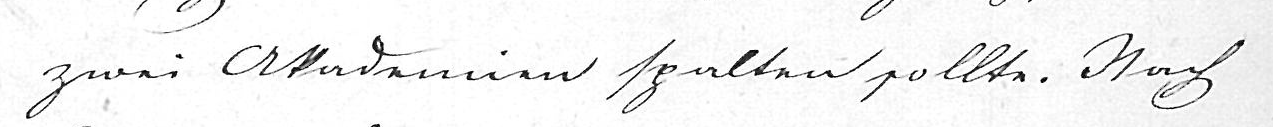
zwei Akademien spalten sollte. Nach
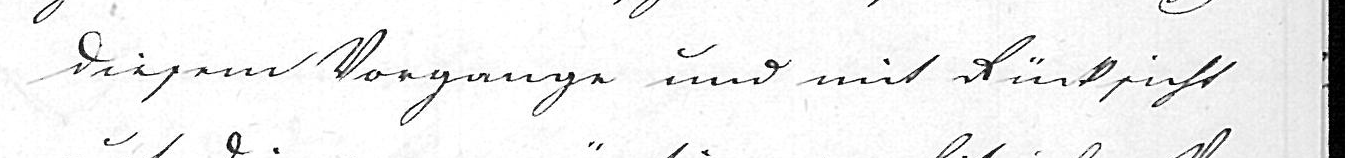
diesem Vorgange und mit Rücksicht
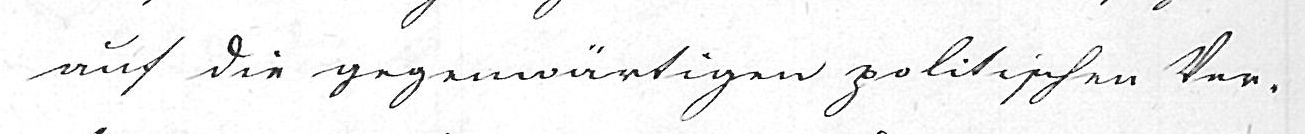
auf die gegenwärtigen politischen Ver-
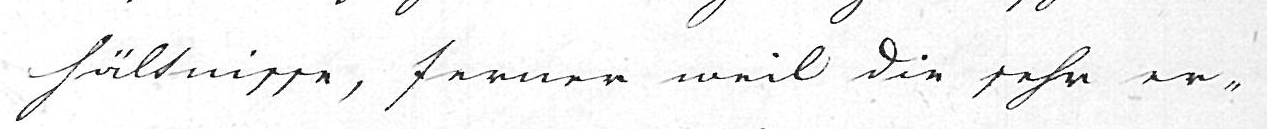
hältnisse, ferner weil die sehr er-
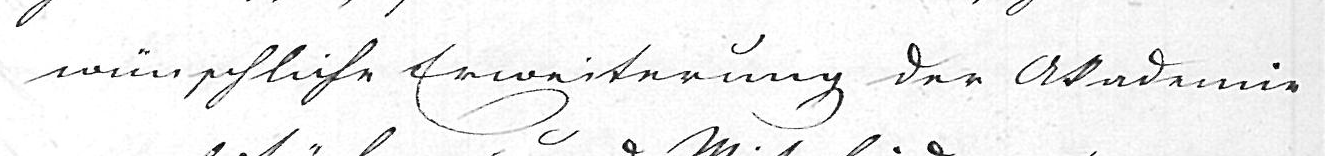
wünschliche Erweiterung der Akademie
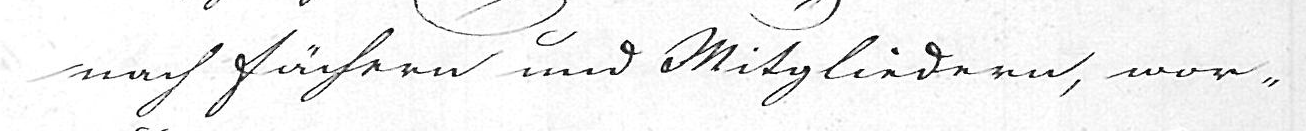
nach Fächern und Mitgliedern, wor-
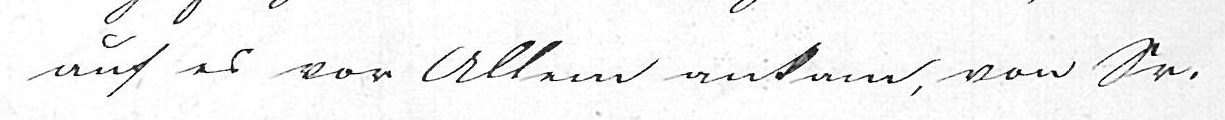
auf es vor Allem ankam, von Sr.
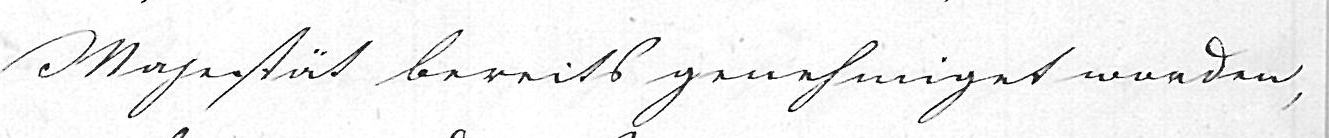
Majestät bereits genehmiget worden,
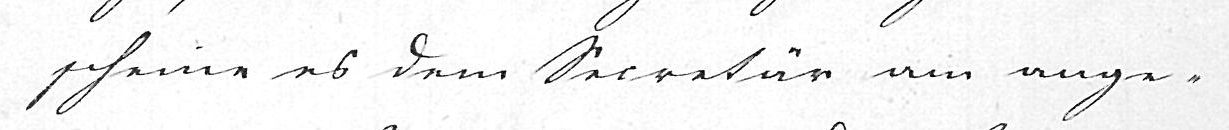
scheine es dem Secretär am ange-
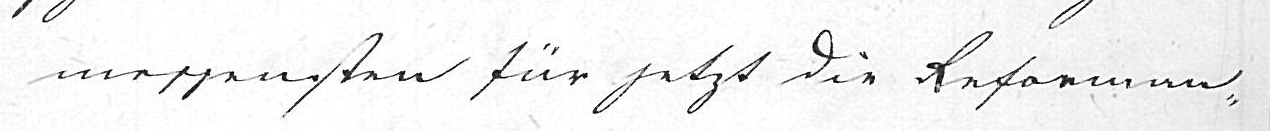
messensten für jetzt die Reforman-
